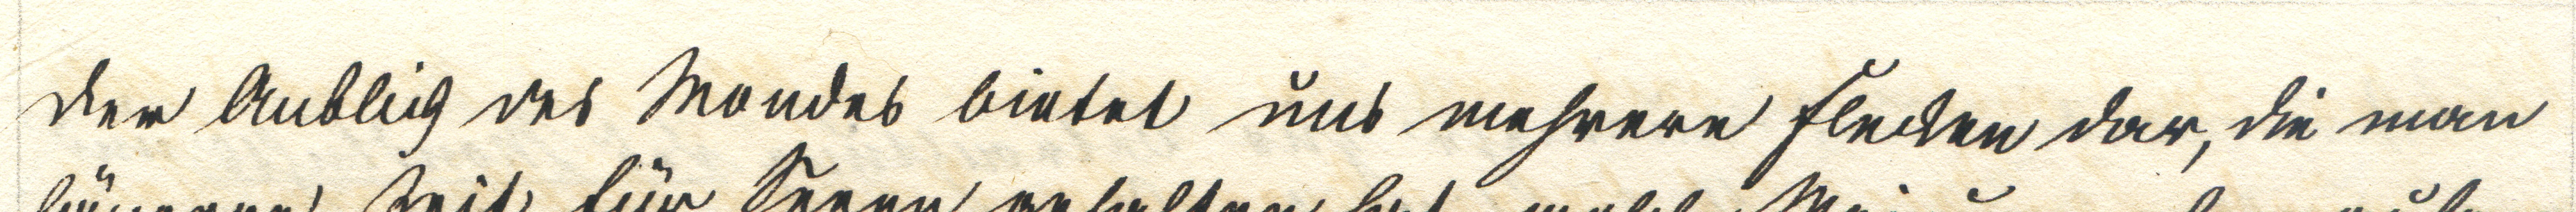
Der Anblick des Mondes bietet uns mehrere Flecken dar, die man
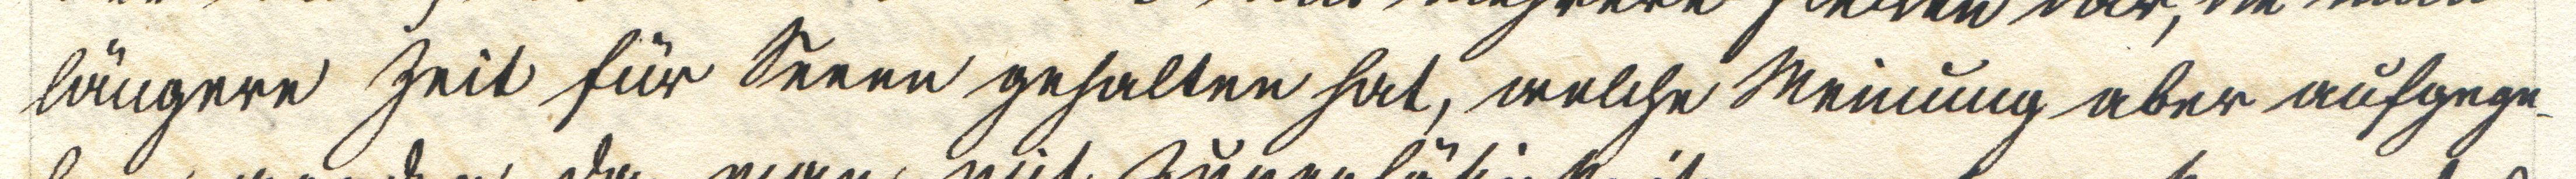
längere Zeit für Seeen gehalten hat, welche Meinung aber aufgege-
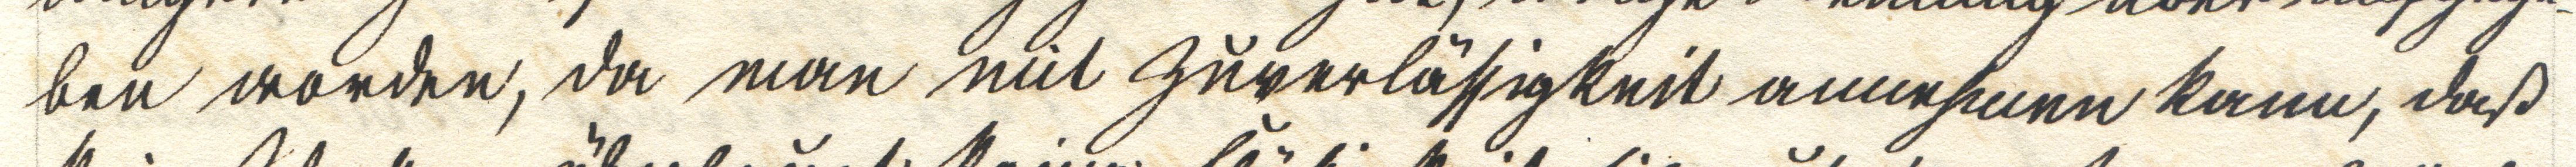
ben worden, da man mit Zuverlässigkeit annehmen kann, daß
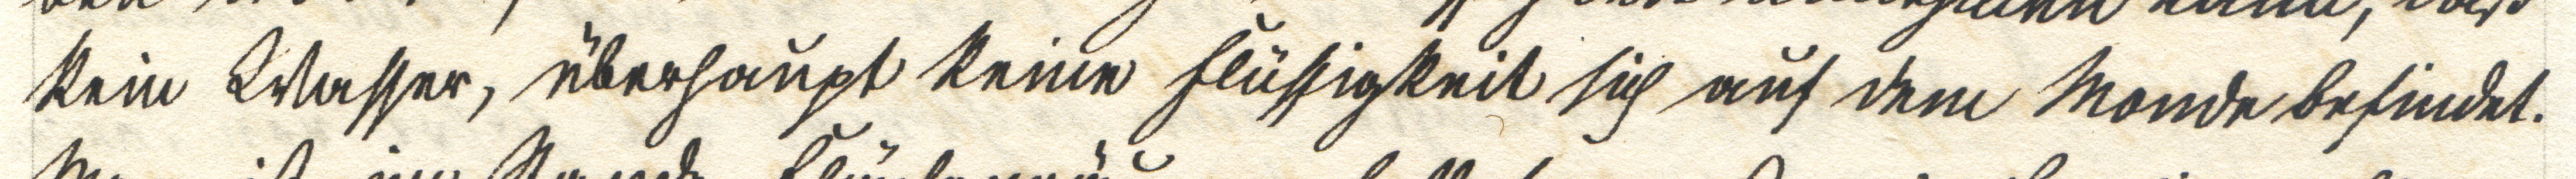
kein Wasser, überhaupt keine Flüssigkeit sich auf dem Monde befindet.
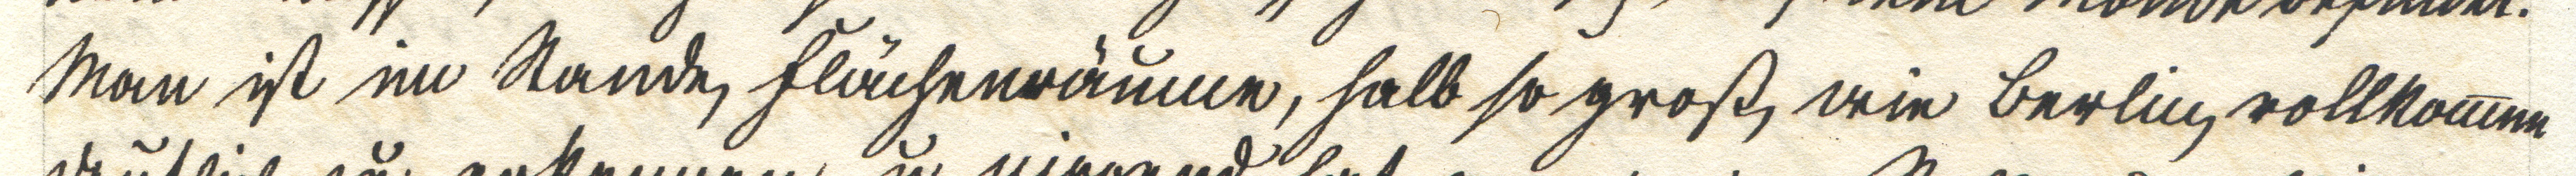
Man ist im Stande, Flächenräume, halb so groß, wie Berlin vollkom̃en
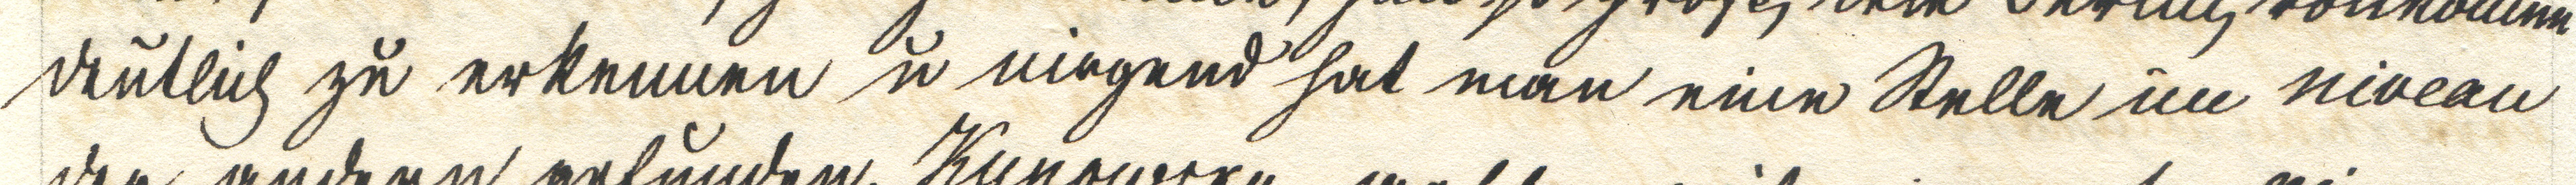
deutlich zu erkennen u nirgend hat man eine Stelle im niveau
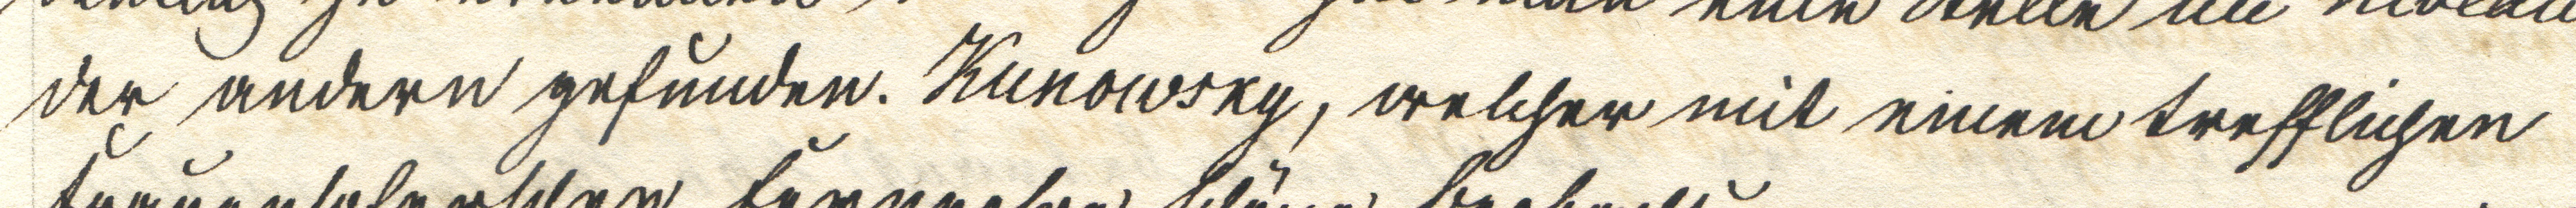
der andern gefunden. Kunowsky, welcher mit einem trefflichen
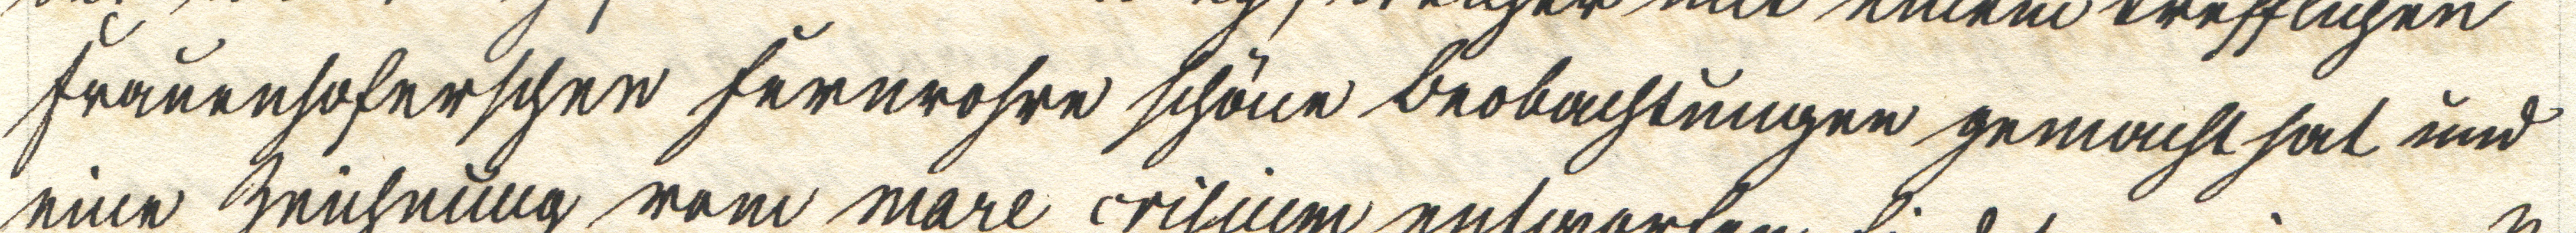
Frauenhoferschen Fernrohre schöne Beobachtungen gemacht hat und
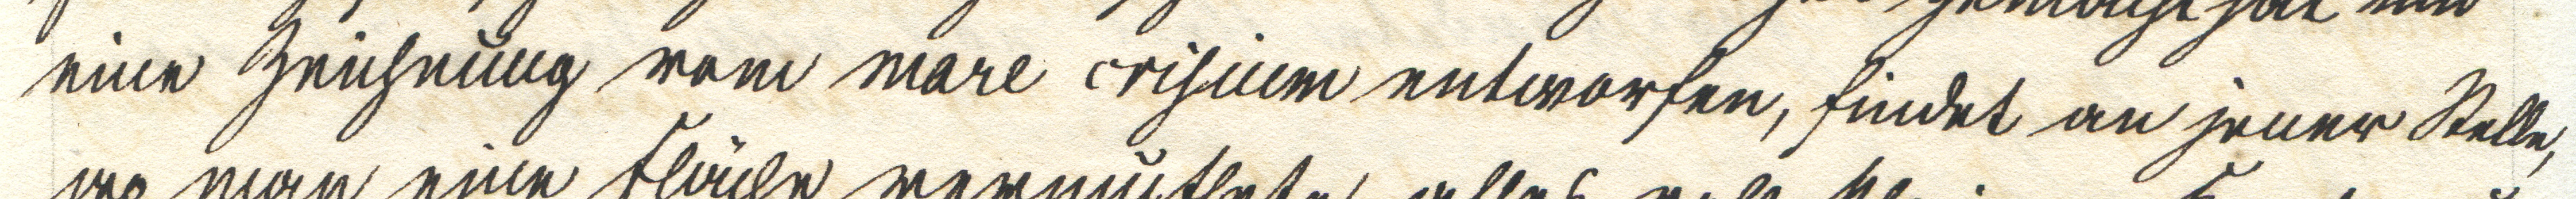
eine Zeichnung vom mare crisium entworfen, findet an jener Stelle,
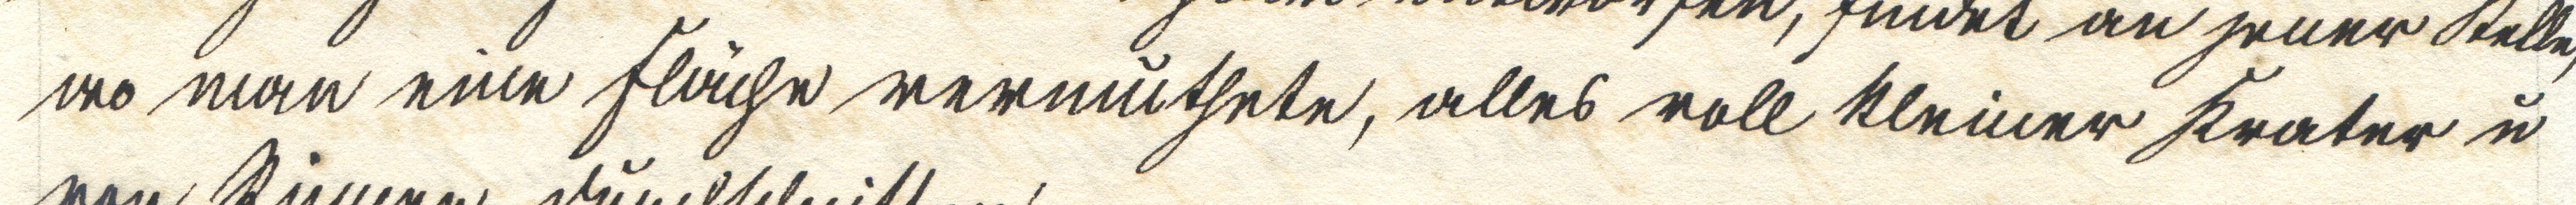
wo man eine Fläche vermuthete, alles voll kleiner Krater u
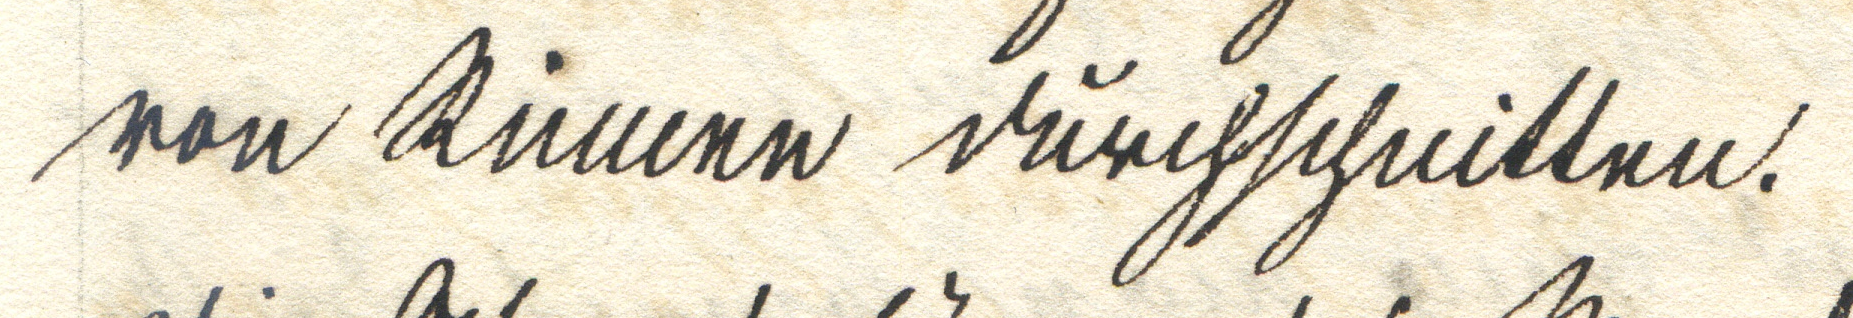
von Rinnen durchschnitten.
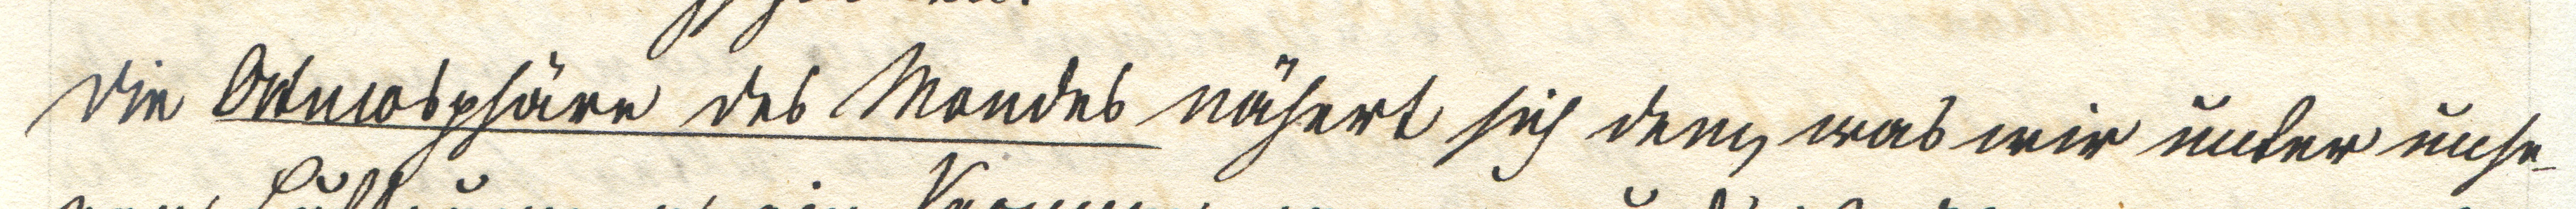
Die Atmosphäre des Mondes nähert sich dem, was wir unter unse-
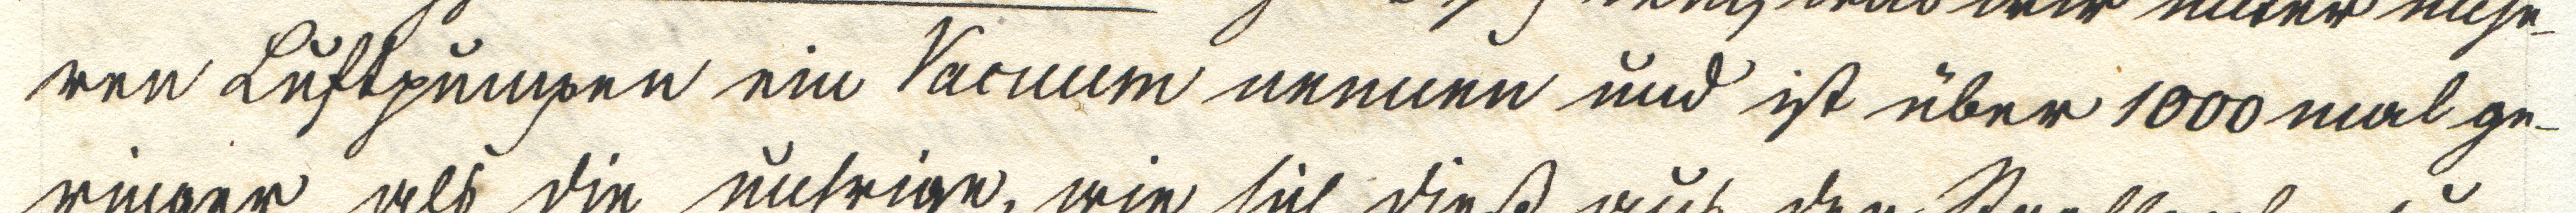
ren Luftpumpen ein Vacuum nennen und ist über 1000 mal ge-
